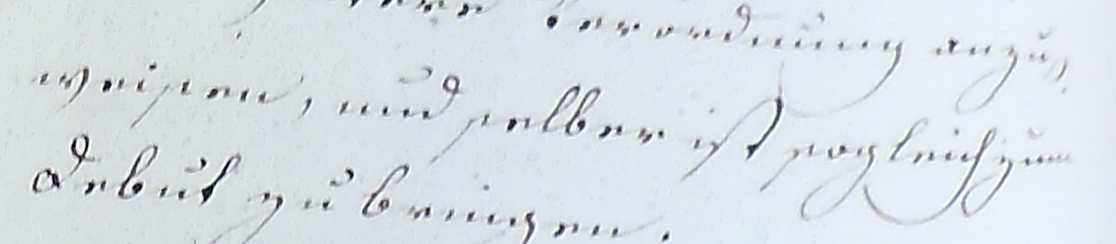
weisen, und selber ist sogleich zum
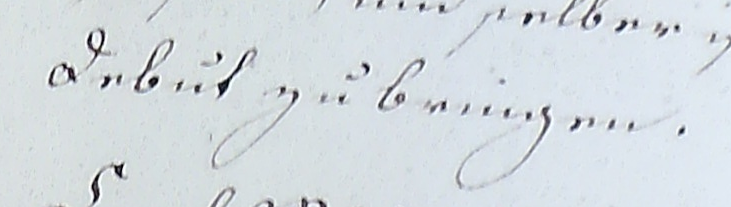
Debut zubringen.
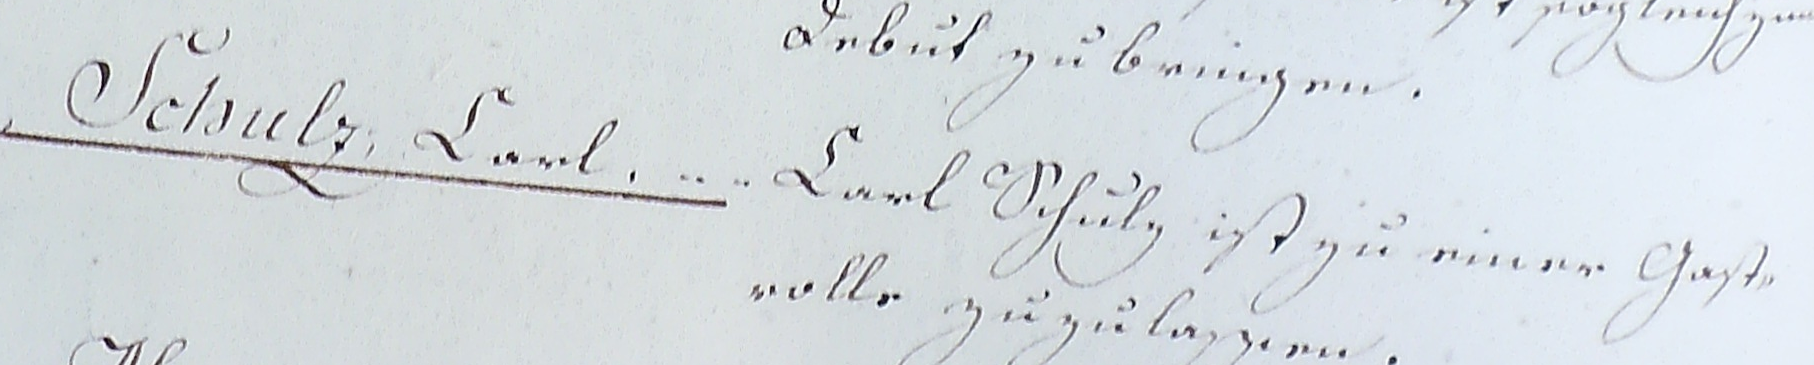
Schulz, Carl. .. .. Carl Schutlz ist zu einer Gast¬
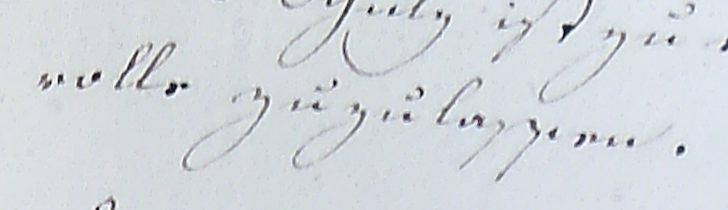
rolle zuzulassen.
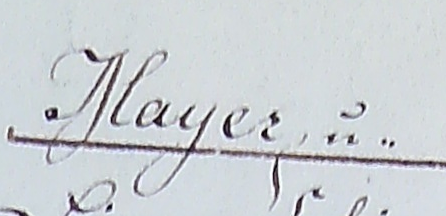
Mayer, u.
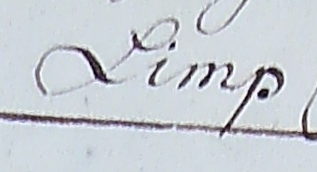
Limp
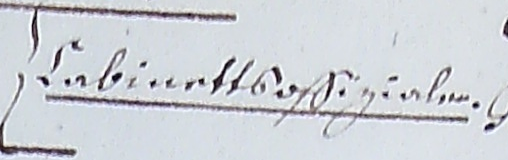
Cabinettsoffizialer.
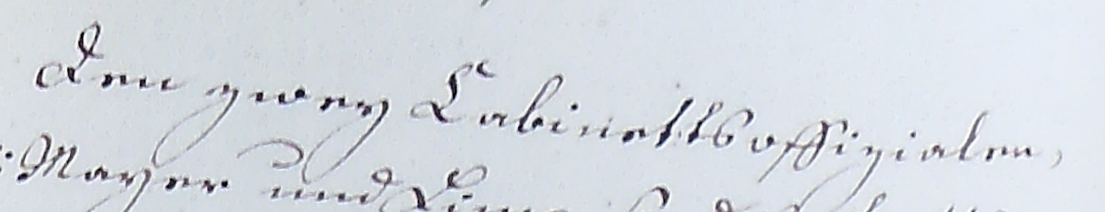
Den zwey C abinettoffizialen
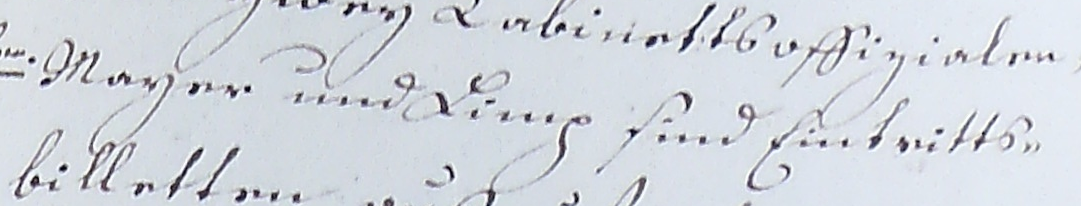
Mayer und Limp sind Eintritts¬
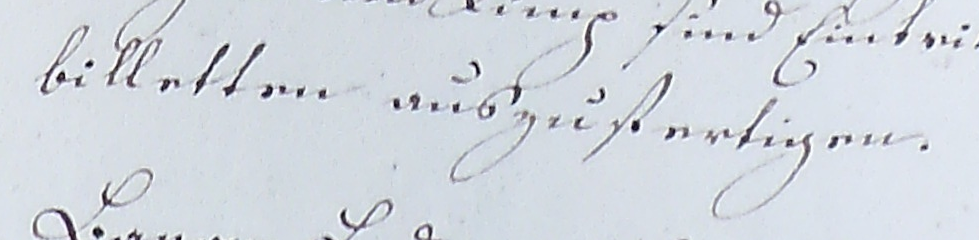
billetten auszufertigen.
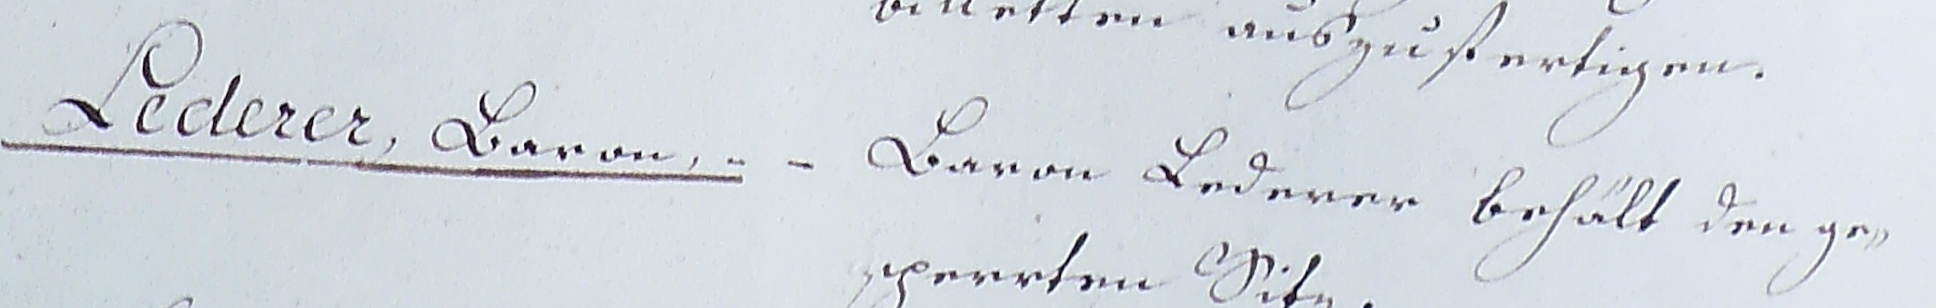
Lederer, Baron. .. .. Baron Lederer behält den ge¬
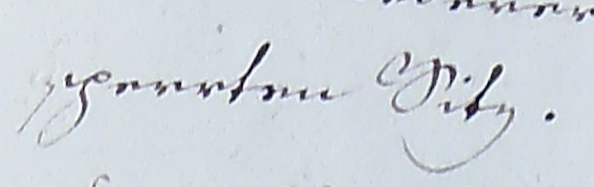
sperrten Sitz.
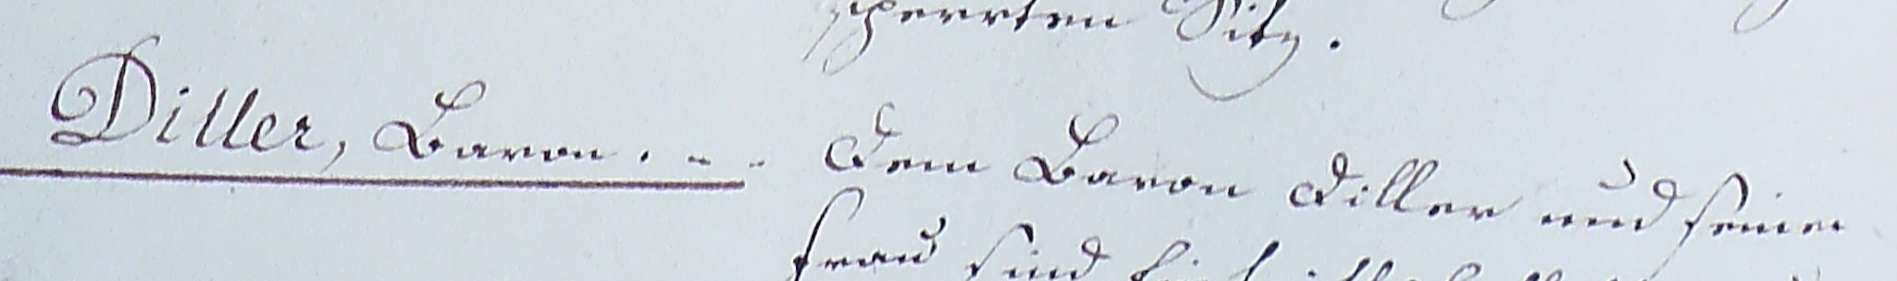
Diller, Baron. .. .. Dem Baron Diller und seiner
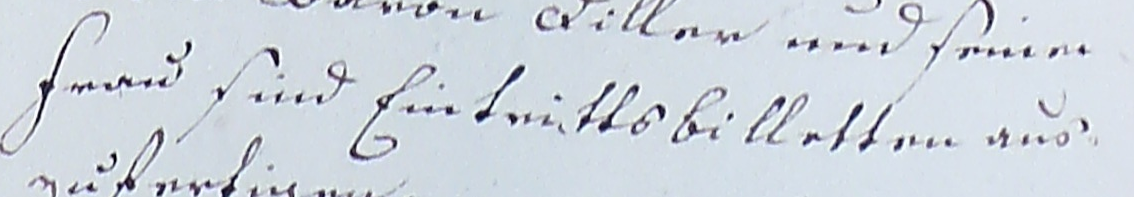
Frau sind Eintrittsbilletten aus¬
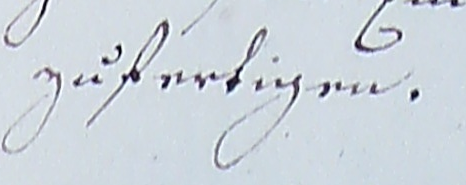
zufertigen.
